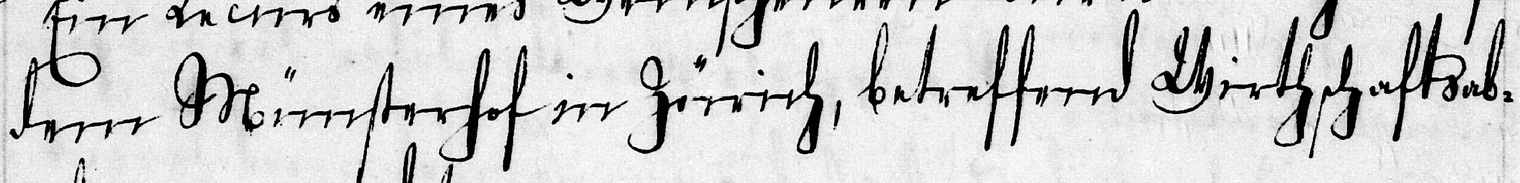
dem Münsterhof in Zürich, betreffend Wirthschaftsab¬
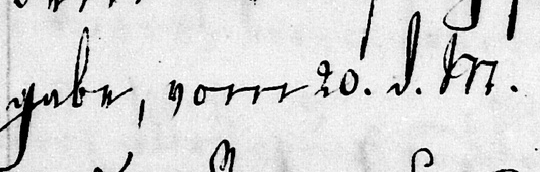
gabe, vom 20. d. M.
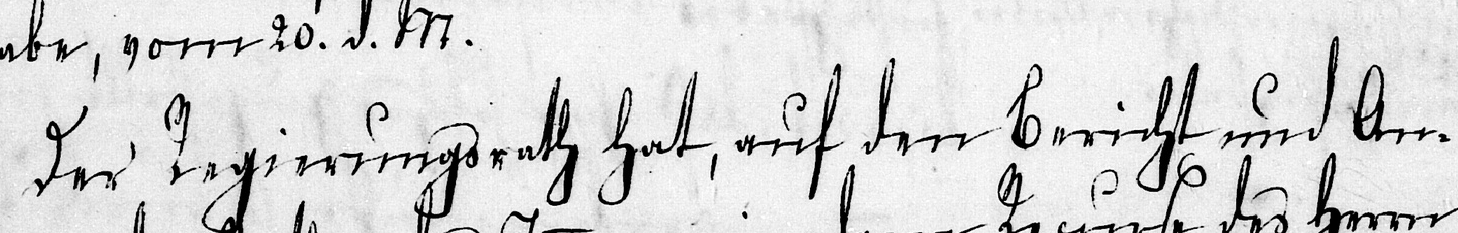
Der Regierungsrath hat, auf den Bericht und An¬
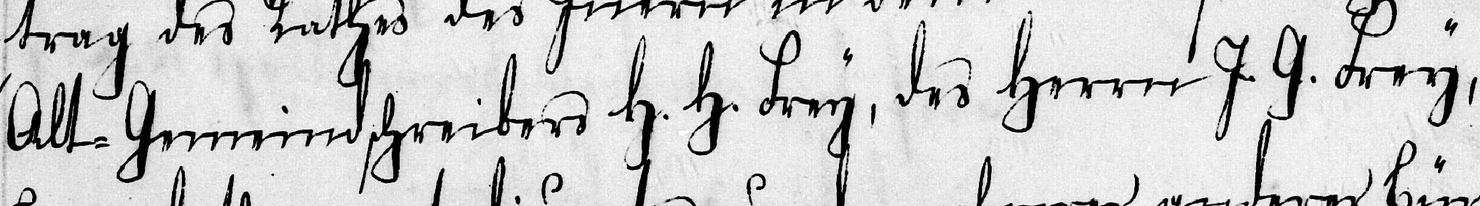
Alt-Gemeindschreibers H. H. Frey, des Herrn J. G. Frey,
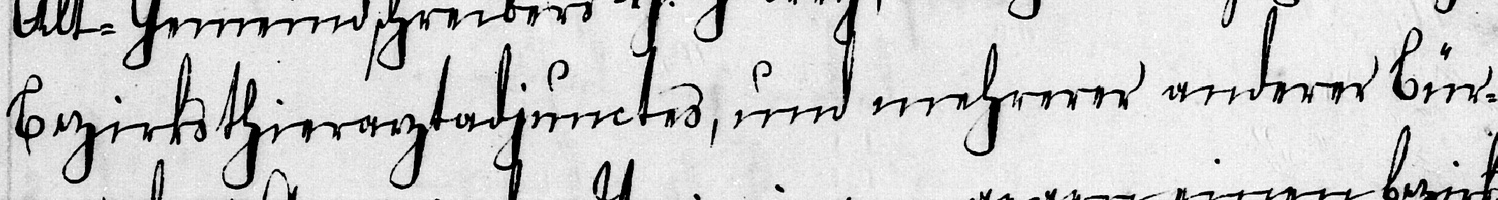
Bezirksthierarztadjunctes, und mehrerer anderer Bür¬
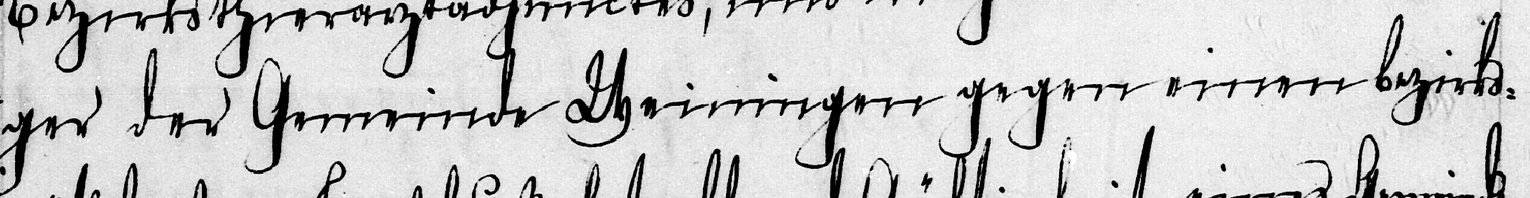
ger der Gemeinde Weiningen gegen einen bezirks¬
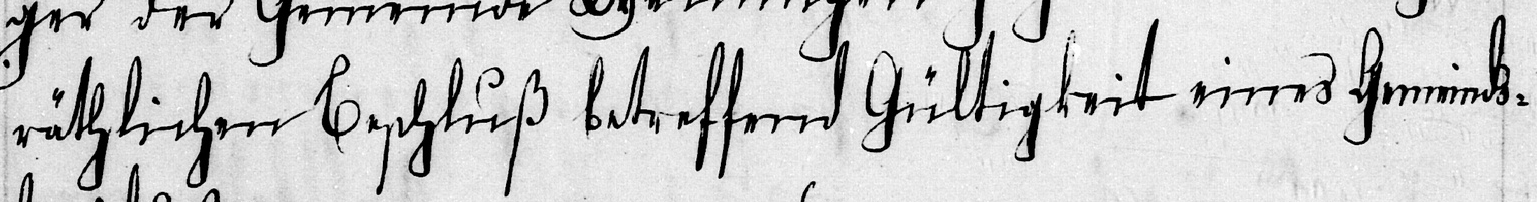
räthlichen Beschluß betreffend Gültigkeit eines Gemeinds¬
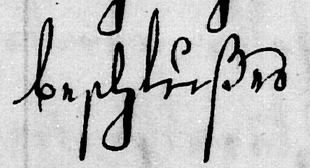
beschlußes
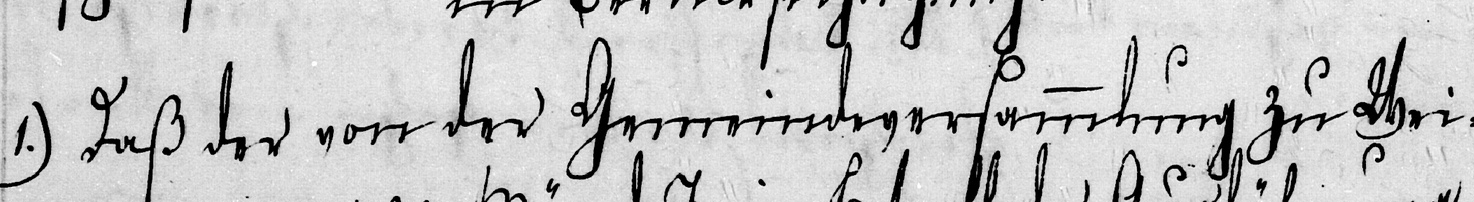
1.) Daß der von der Gemeindeversammlung zu Wei¬
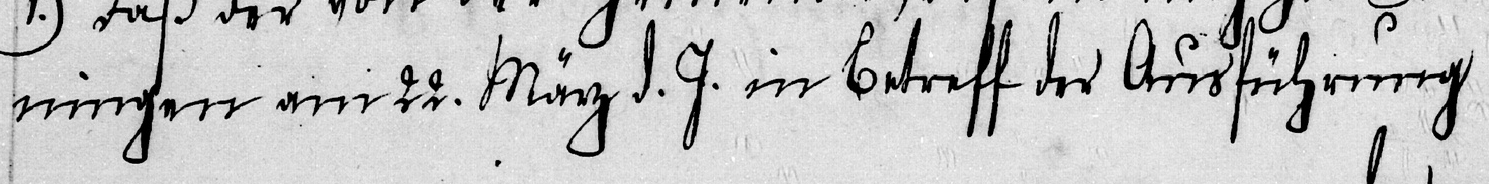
ningen am 22. März d. J. in Betreff der Ausführung
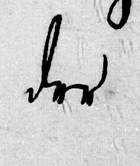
des
